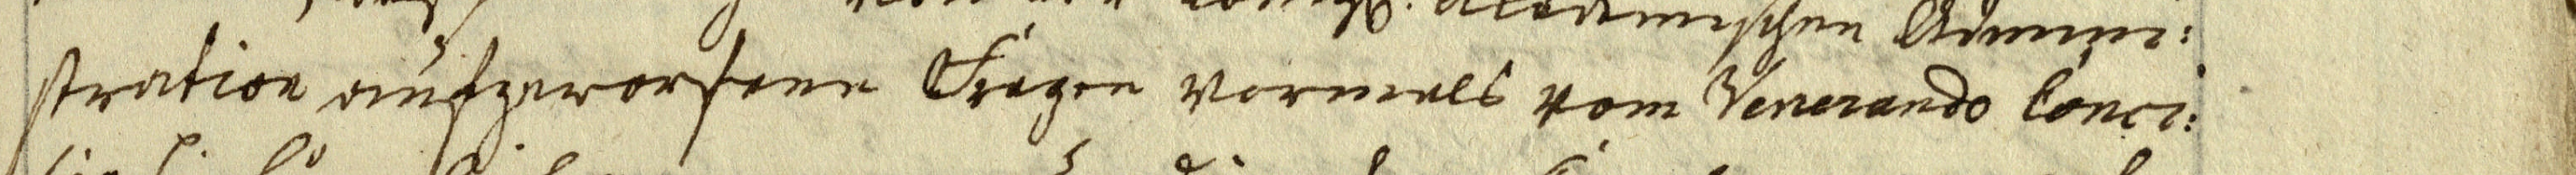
stration aufgeworfene Fragen vormals vom Venerando Conci¬
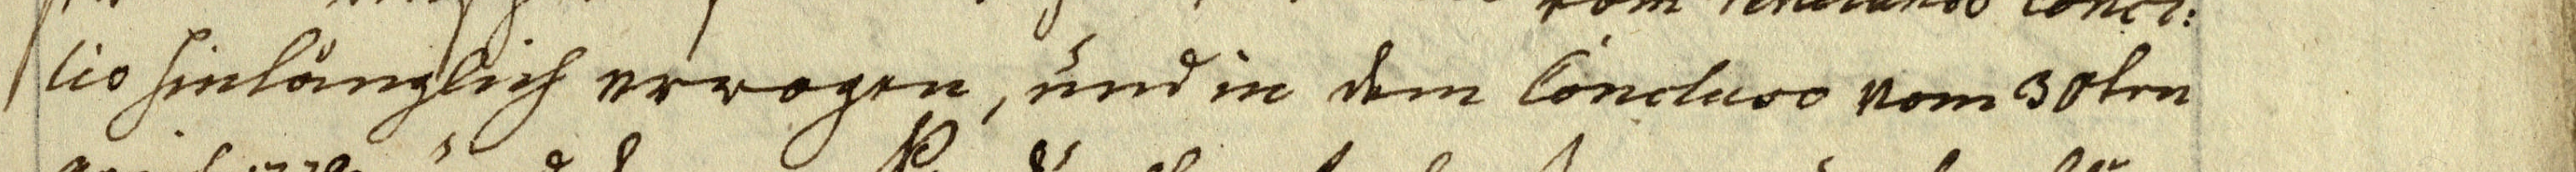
lio hinlänglich erwogen, und in dem Concluso vom 30ten
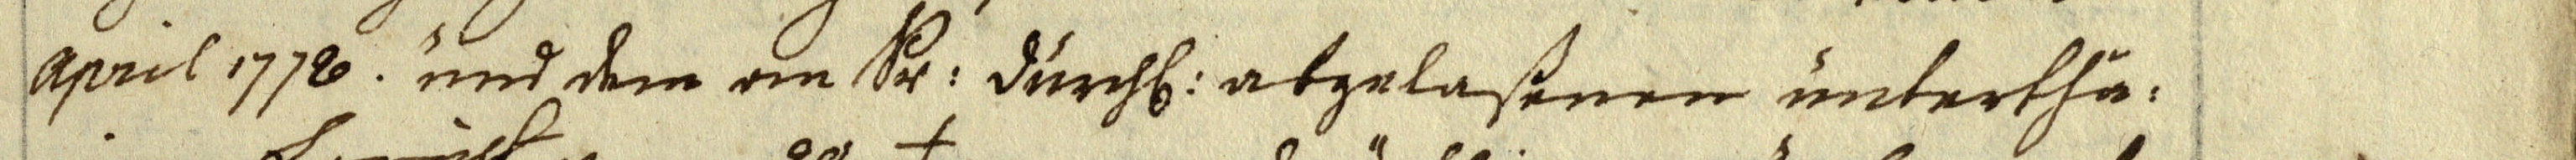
April 1778. und dem an Sr Durchl. abgelaßenen unterthä¬
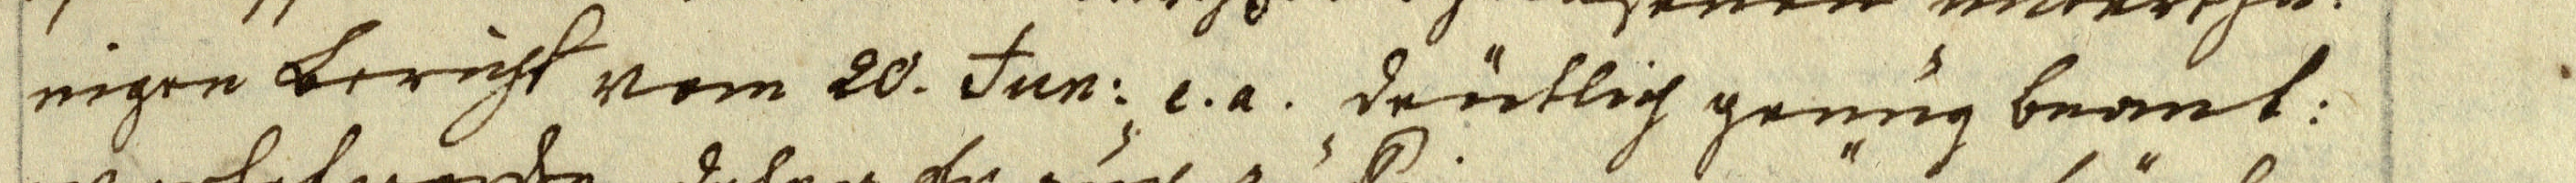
nigen Bericht vom 20. Jun. e. a. deutlich genug beant¬
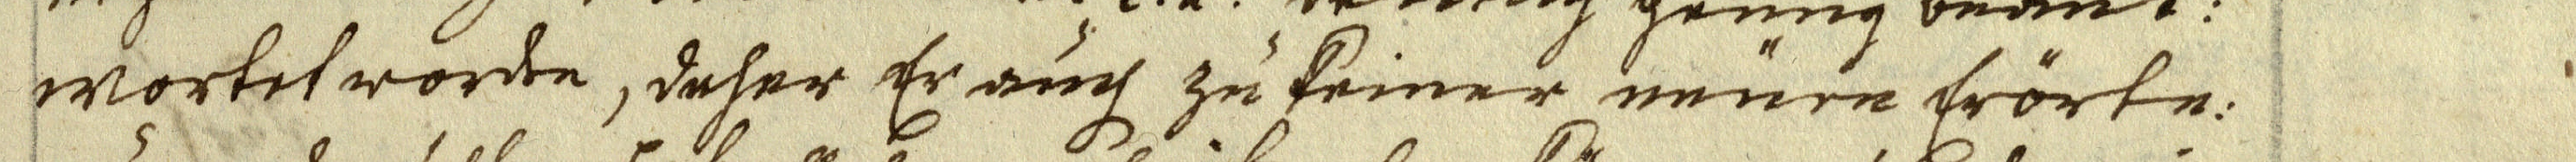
wortet worden, daher Er auch zu keiner neuen Erörte¬
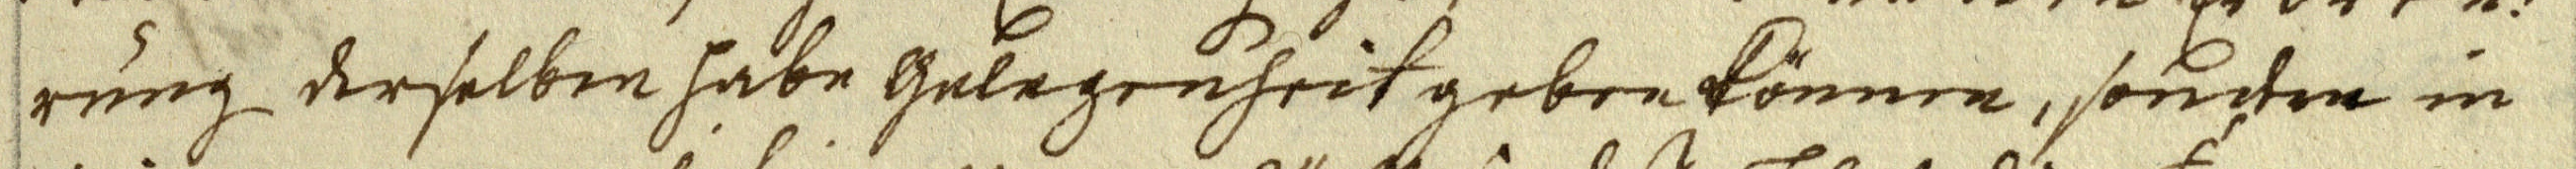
rung derselben habe Gelegenheit geben können, sondern in
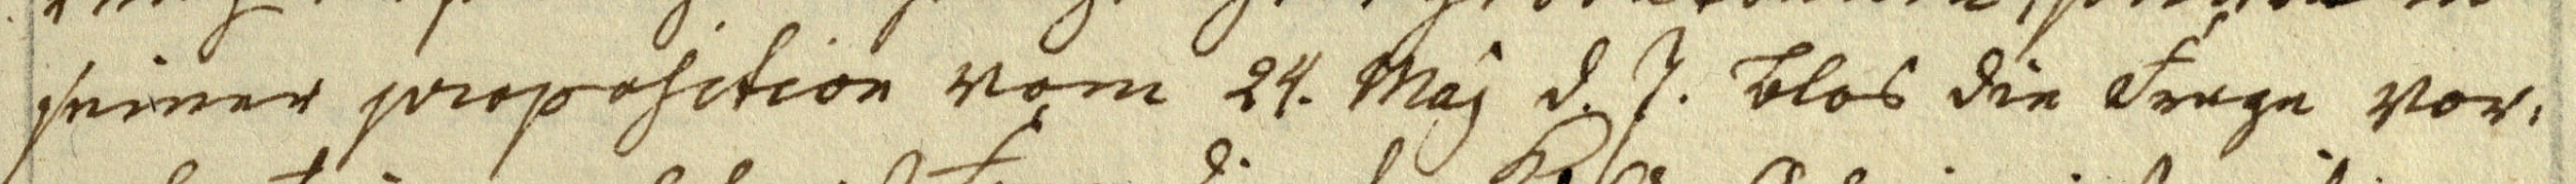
seiner proposition vom 24. Maj d.J. blos die Frage vor¬
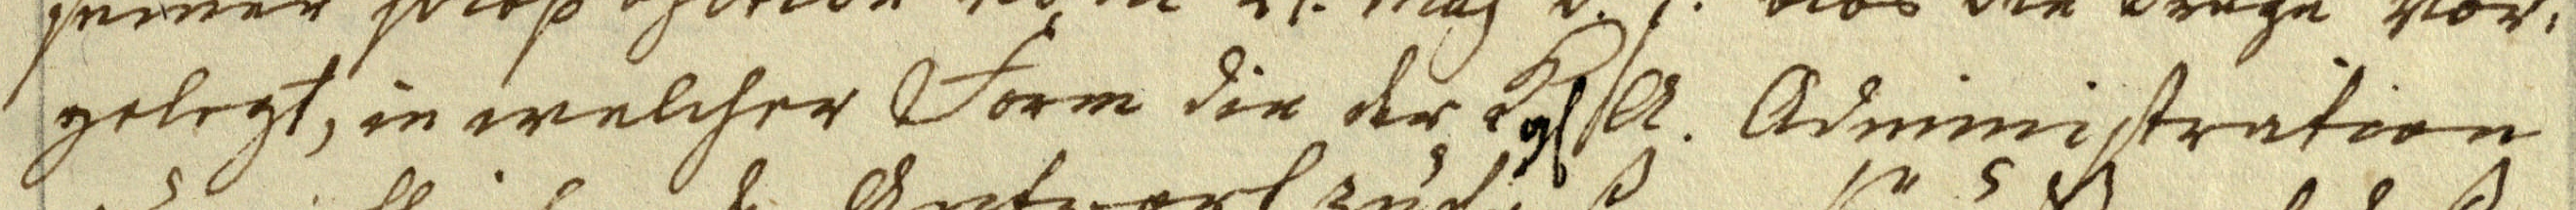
gelegt, in welcher Form die der Kgl A. Administration
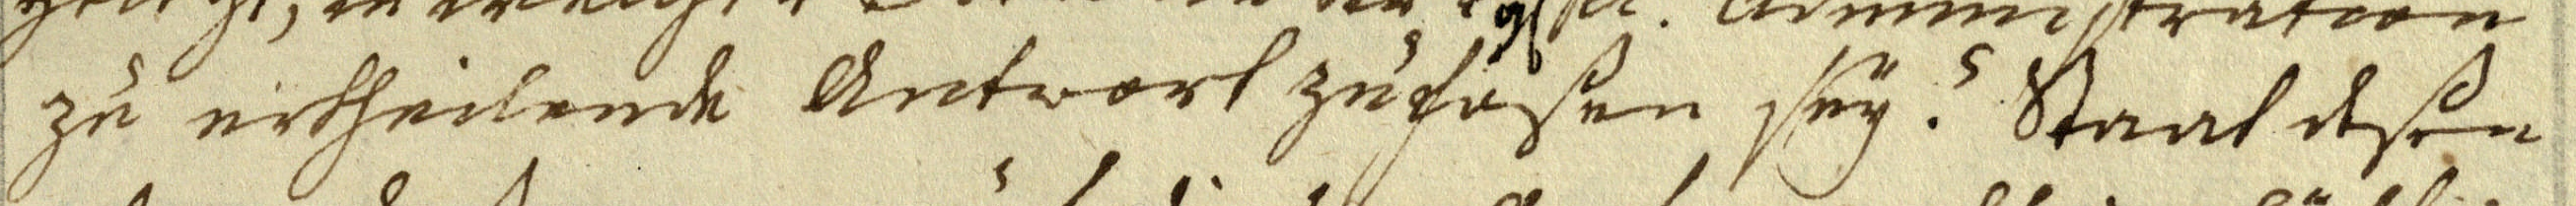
zu ertheilende Antwort zufaßen seÿ? Staat deßen
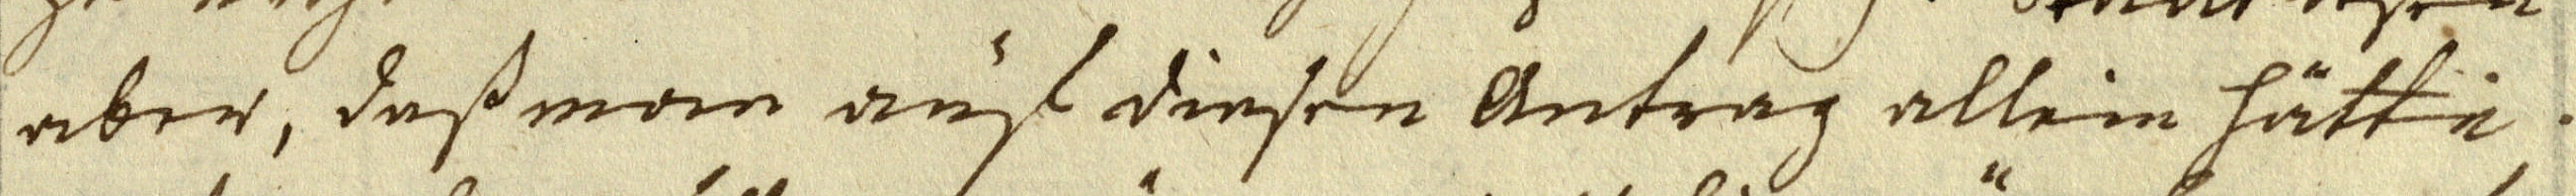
aber, daß man auf diesen Antrag allein hätte
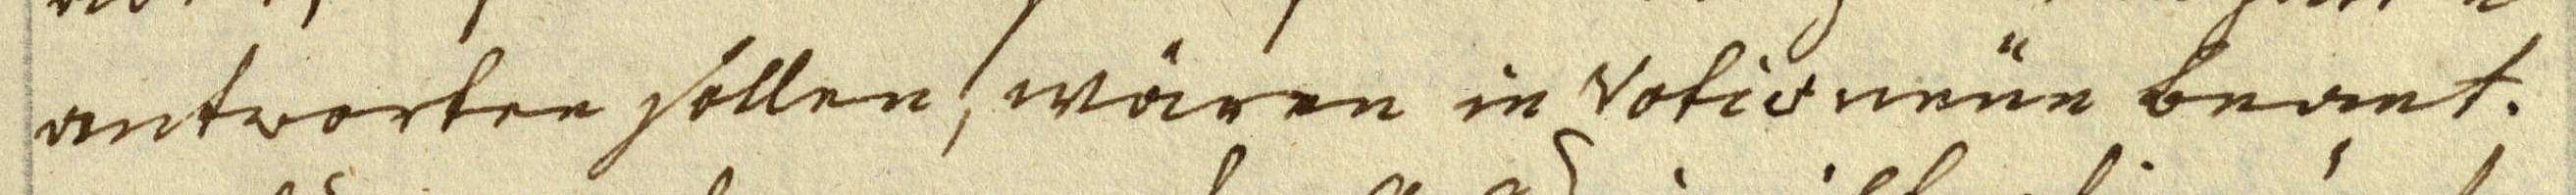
antworten sollen, wären in Votis neue Beant¬
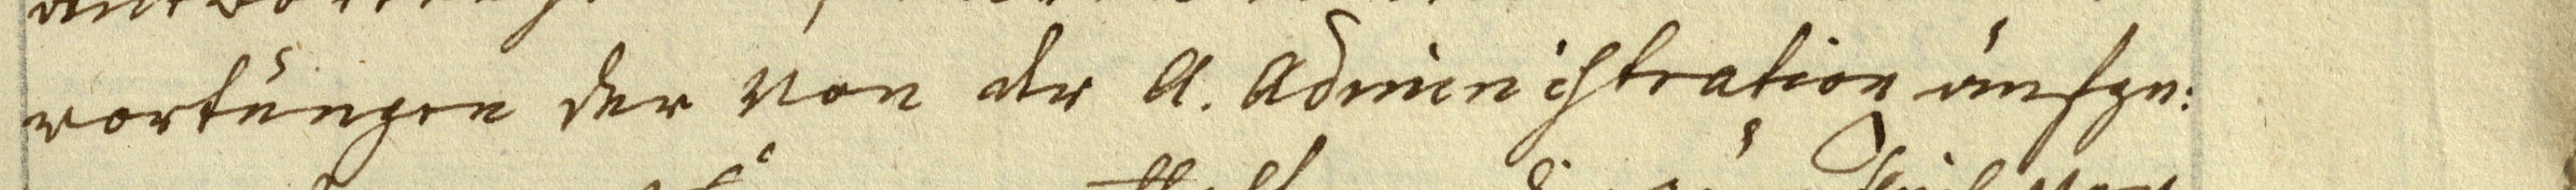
wortungen der von der A. Administration aufge¬
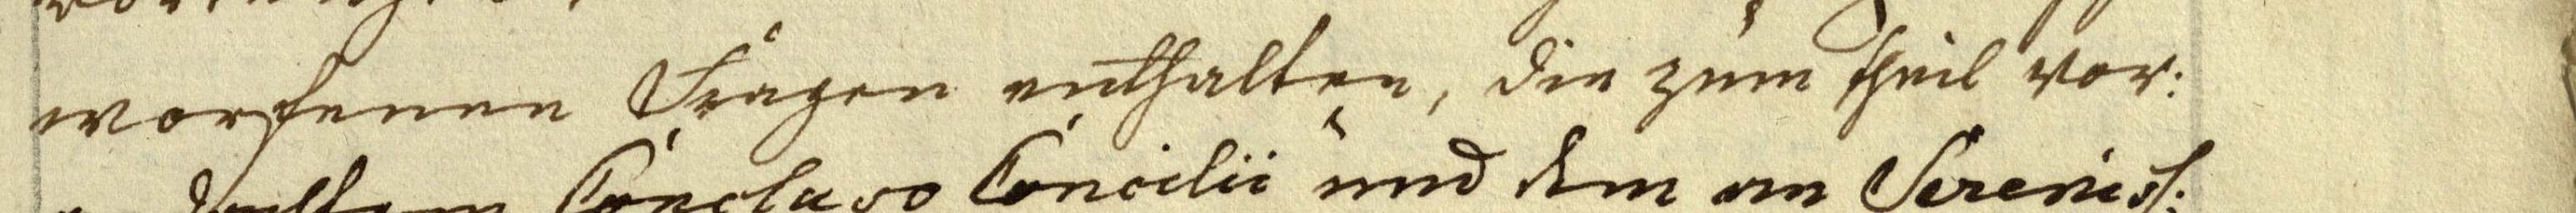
worfenen Fragen enthalten, die zum Theil vor¬
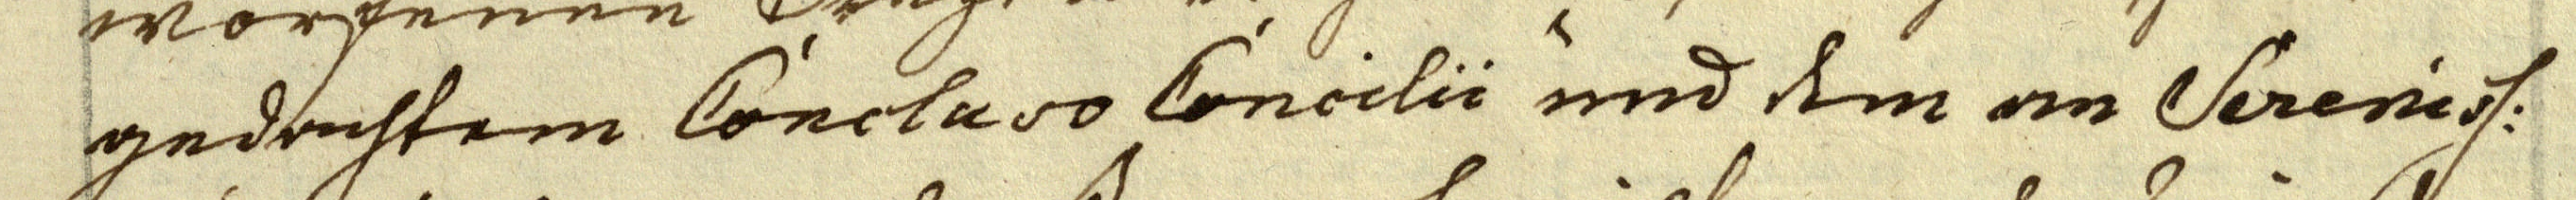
gedachtem Concluso Concilii und dem an Sereniss.
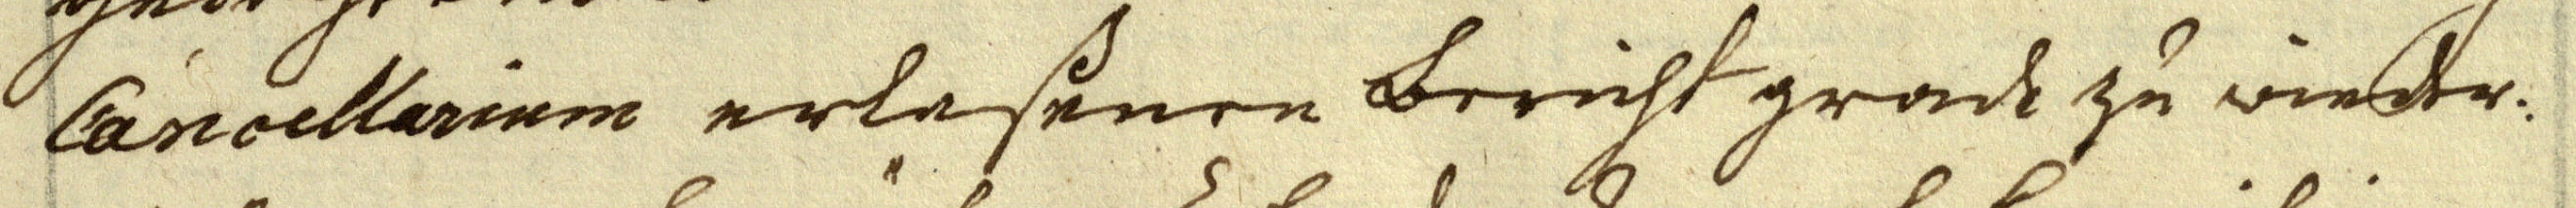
Cancellarium erlaßenen Bericht grade zu wieder¬
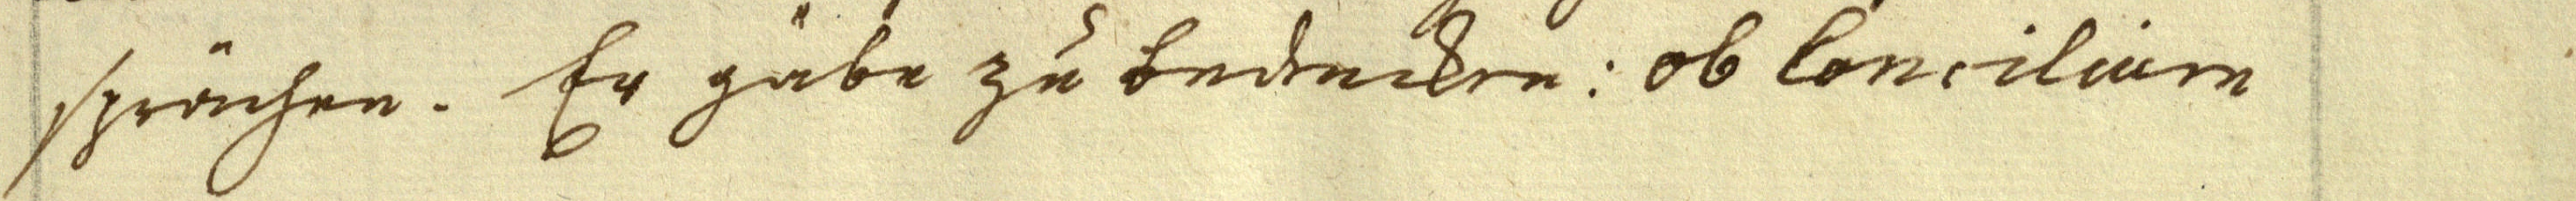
sprächen. Er gäbe zu bedencken: ob Concilium
